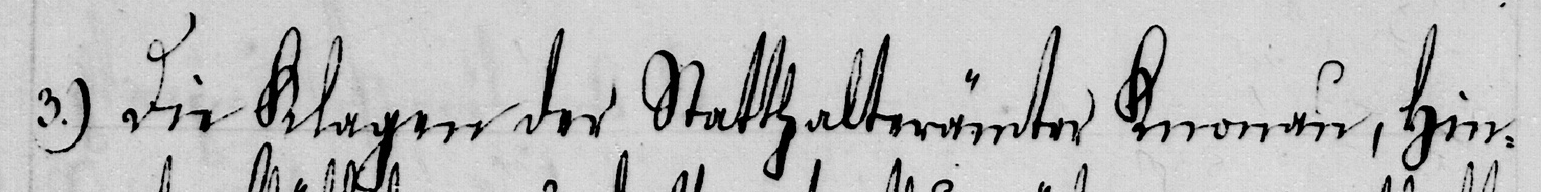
3.) Die Klagen der Statthalterämter Knonau, Hin¬
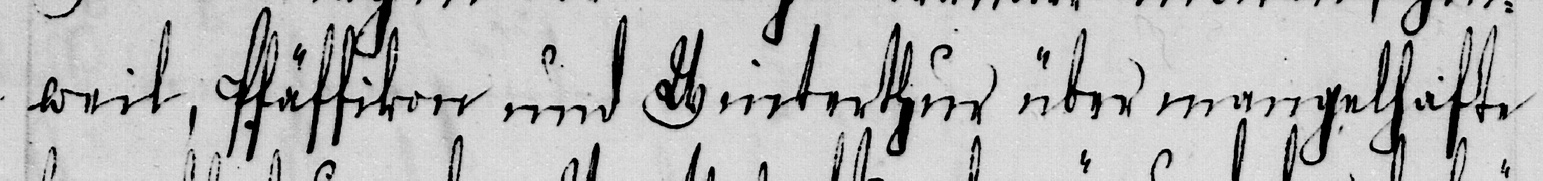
weil, Pfäffikon und Winterthur über mangelhafte
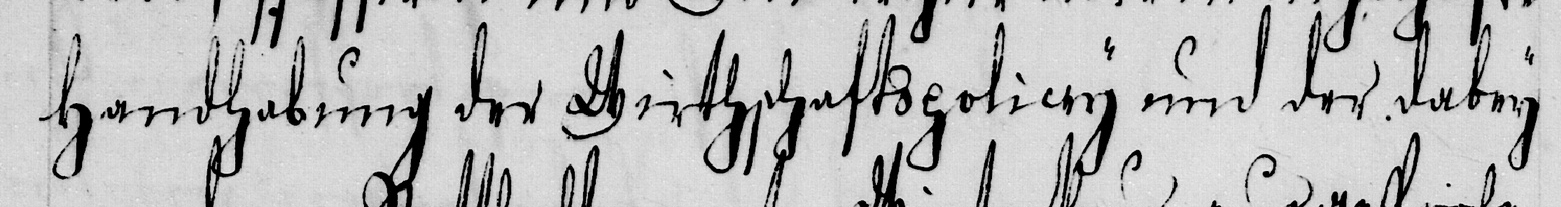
Handhabung der Wirthschaftspolicey und der dabey
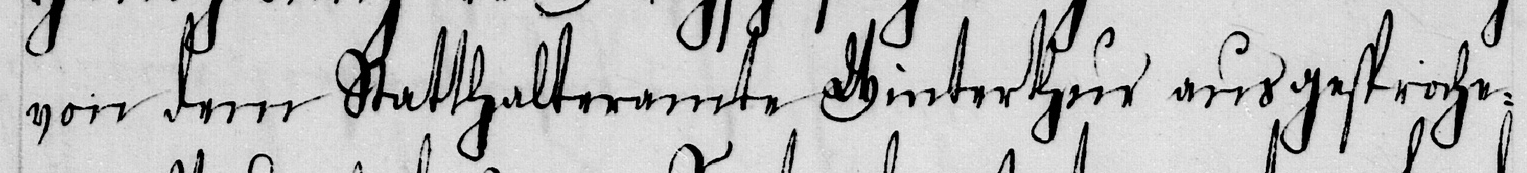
von dem Statthalteramte Winterthur ausgesproche¬
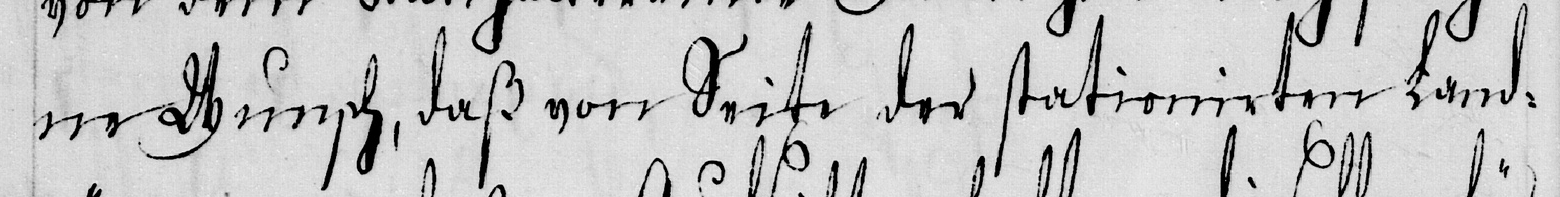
ne Wunsch, daß von Seite der stationirten Land¬
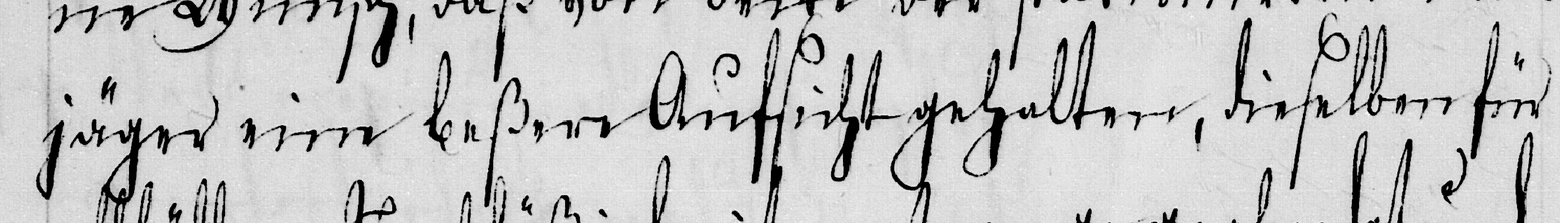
jäger eine beßere Aufsicht gehalten, dieselben für
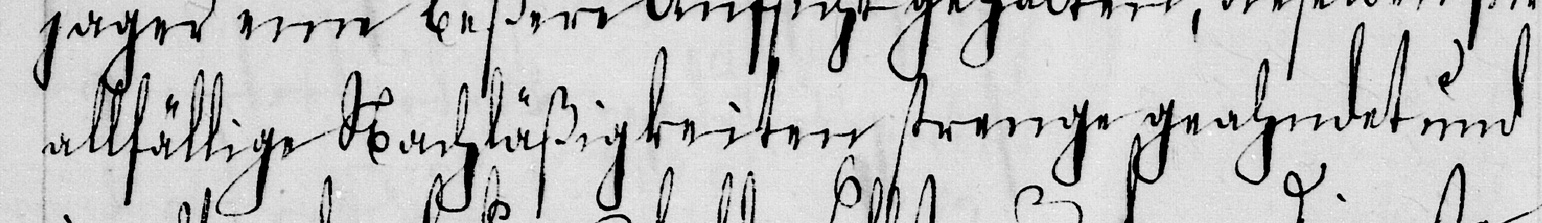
allfällige Nachläßigkeiten strenge[r] geahndet und
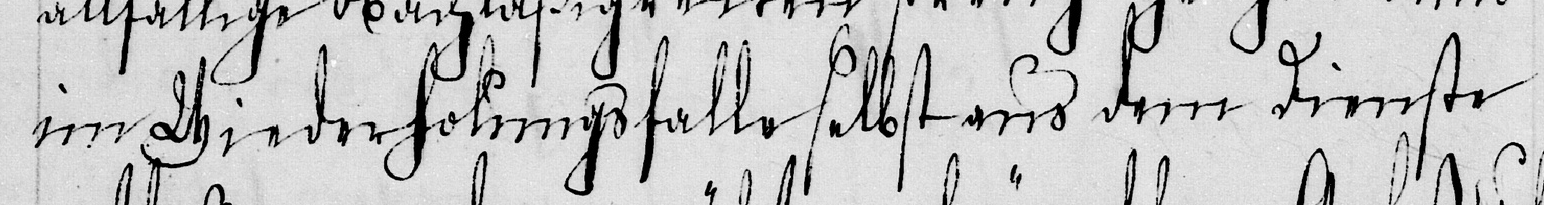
im Wiederholungsfalle selbst aus dem Dienste
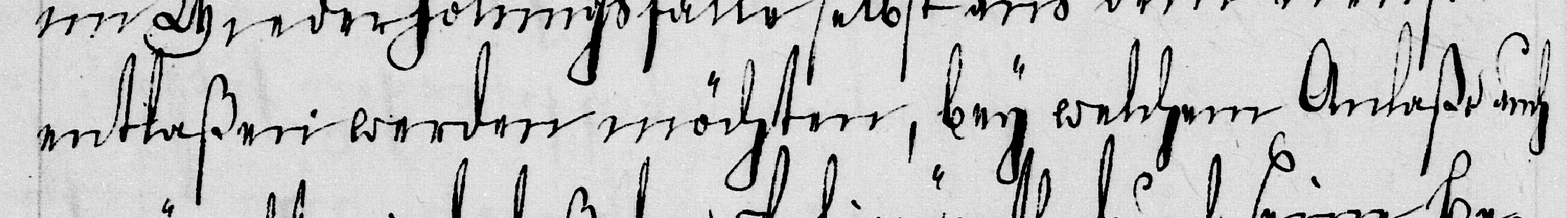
entlaßen werden möchten, bey welchem Anlaße auch
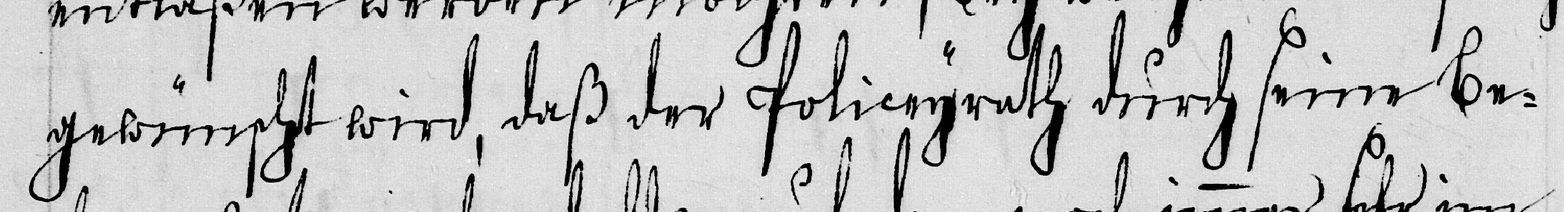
gewünscht wird, daß der Policeyrath durch seine Be¬
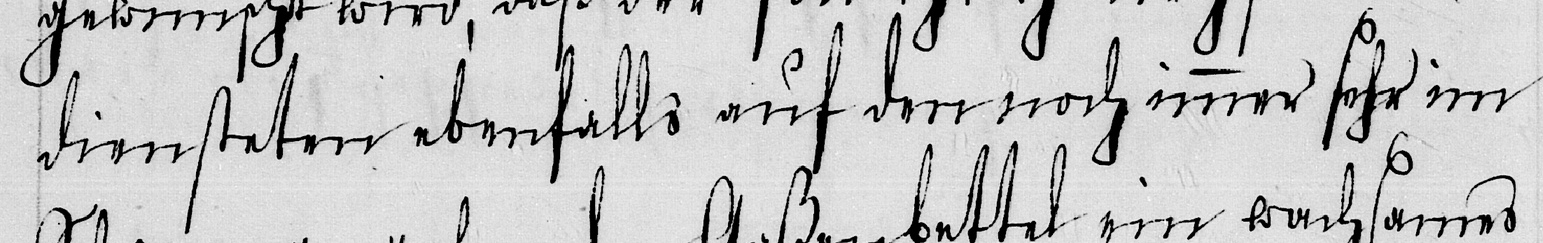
diensteten ebenfalls auf den noch immer sehr im
